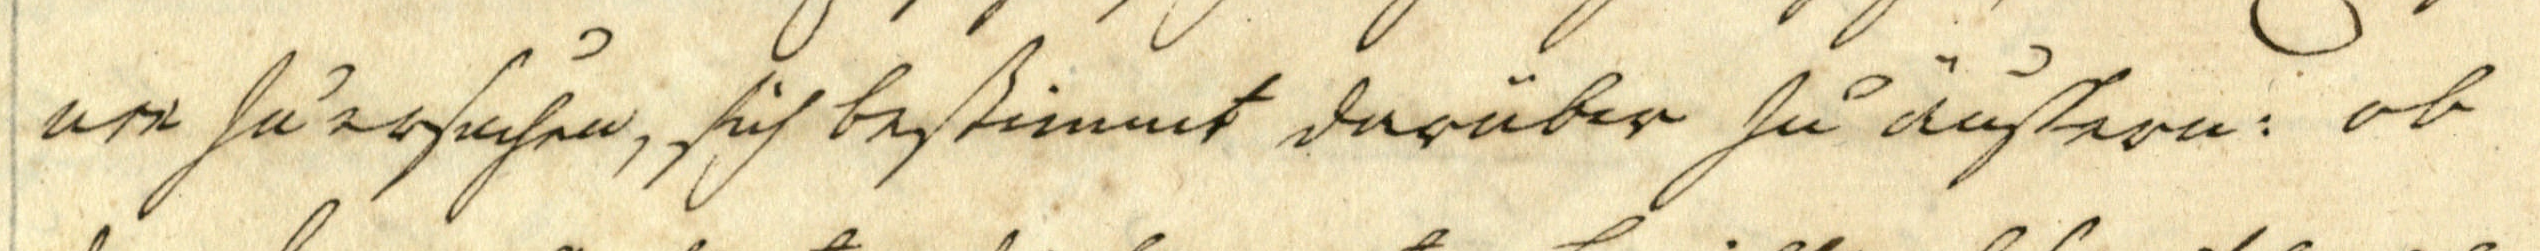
um zu ersuchen, sich bestimmt darüber zu ässern: ob
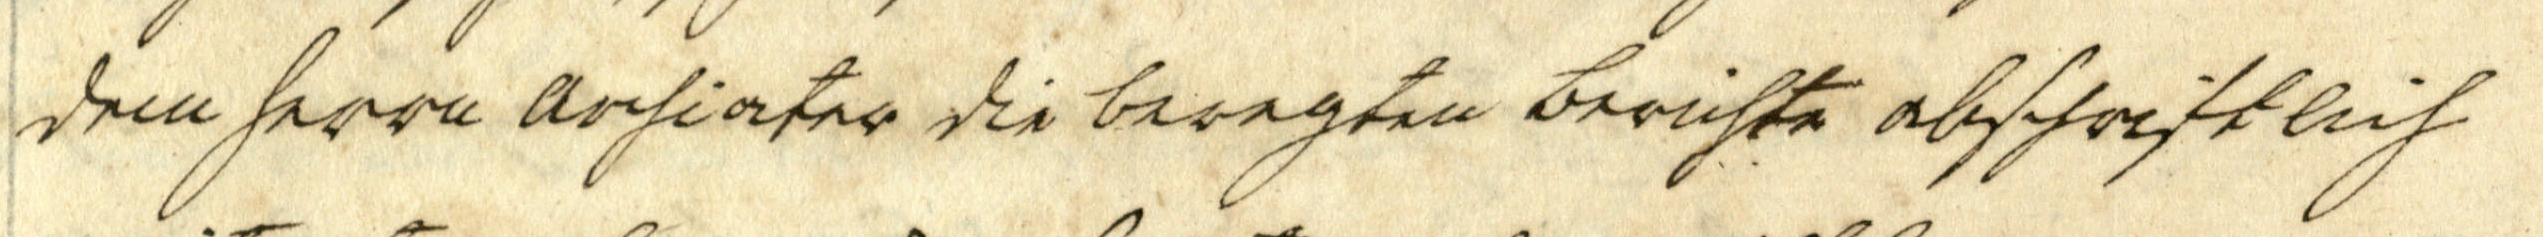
dem Herrn Archiater die beregten Berichte abschriftlich
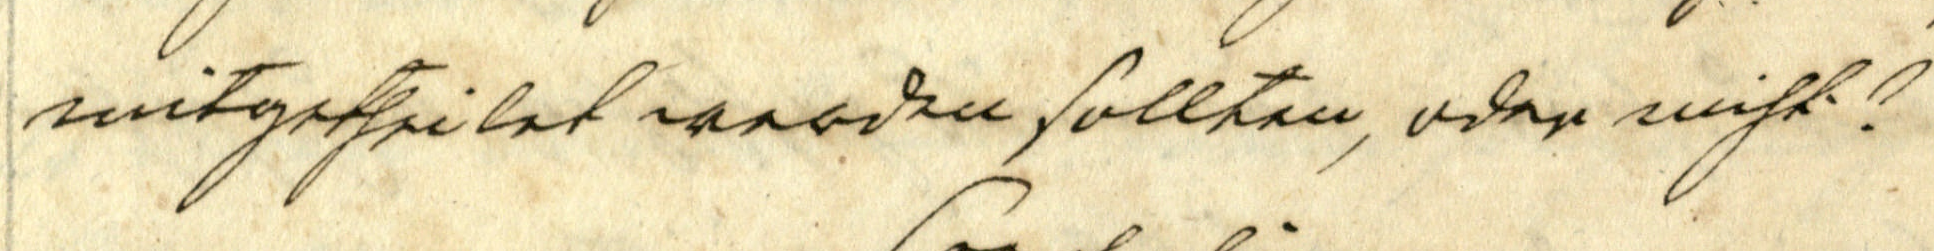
mitgetheilet werden sollten
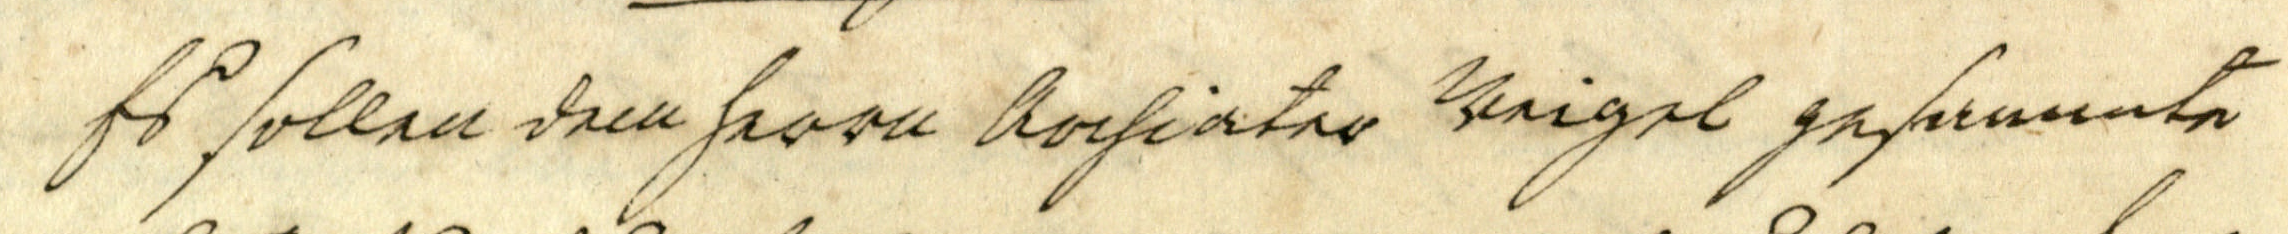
Es sollen dem Herrn Archiater Weigel gesammte
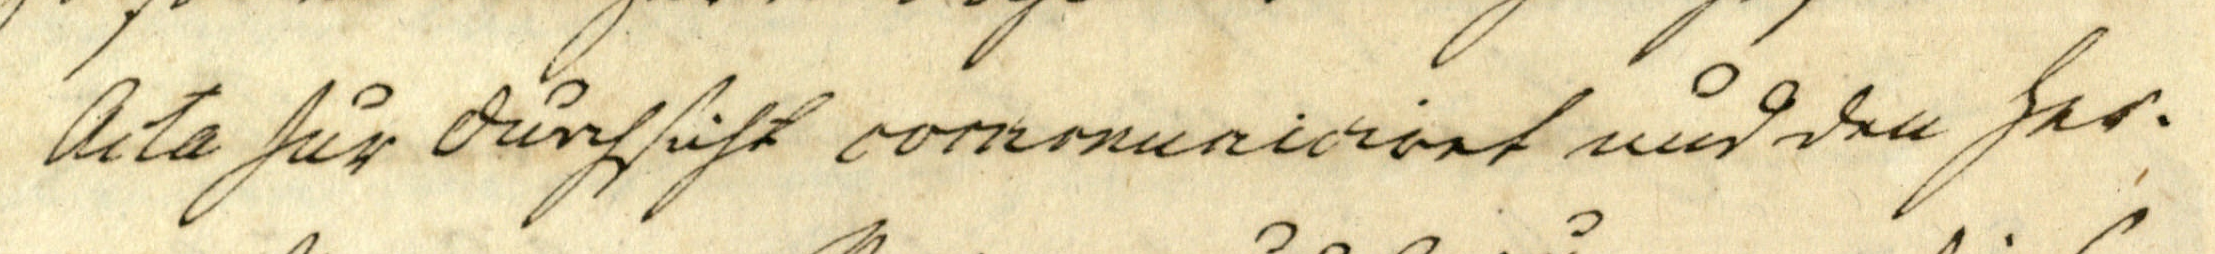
Acta zur Durchsicht communiciret und den Her¬
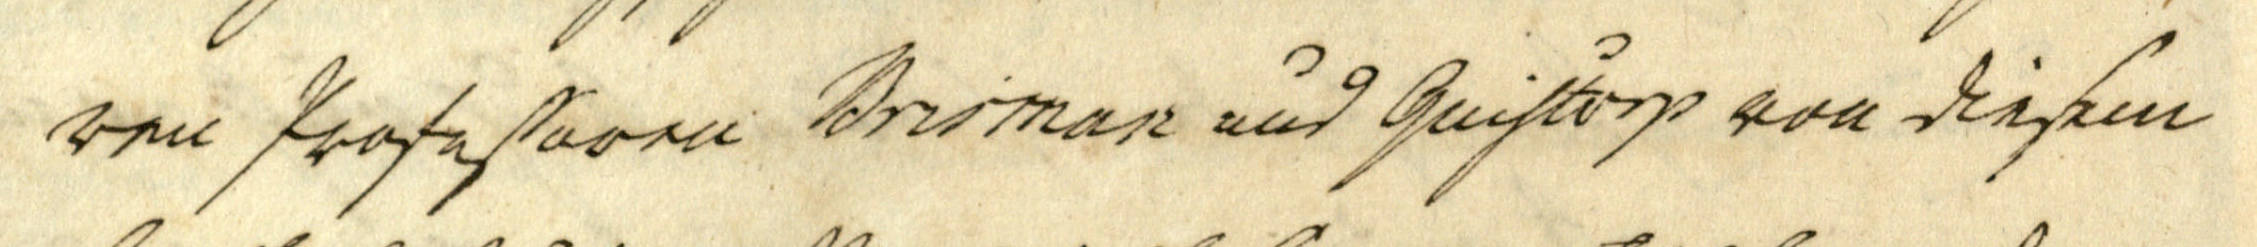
ren Professoren Brisman und Quistorp von diesem
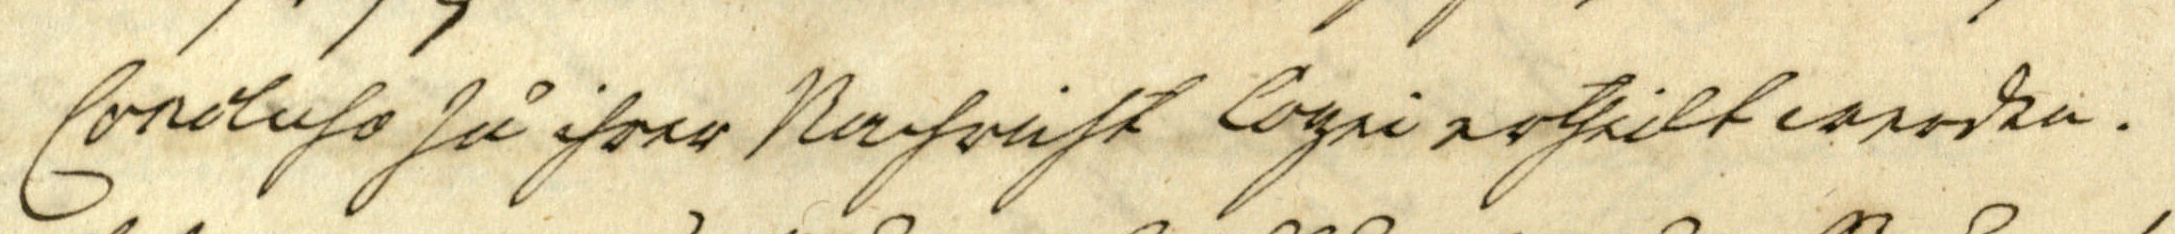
Concluso zu ihrer Nachricht Copei ertheilt werden.
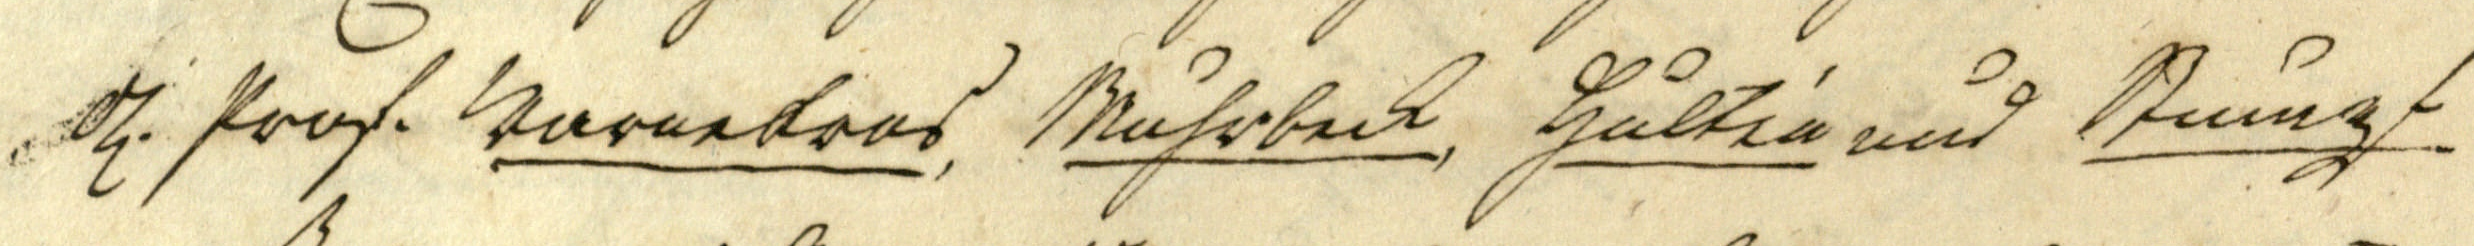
dh. Prof. Warnekros, Muhrbeck, Hultén und Stumpf
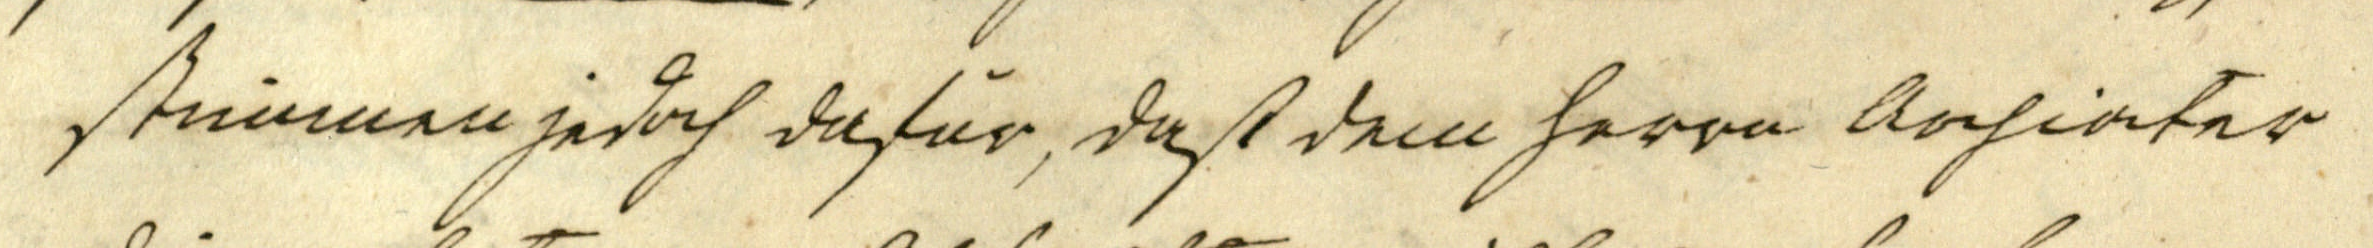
stimmen jedoch dafür, daß dem Herrn Archiater
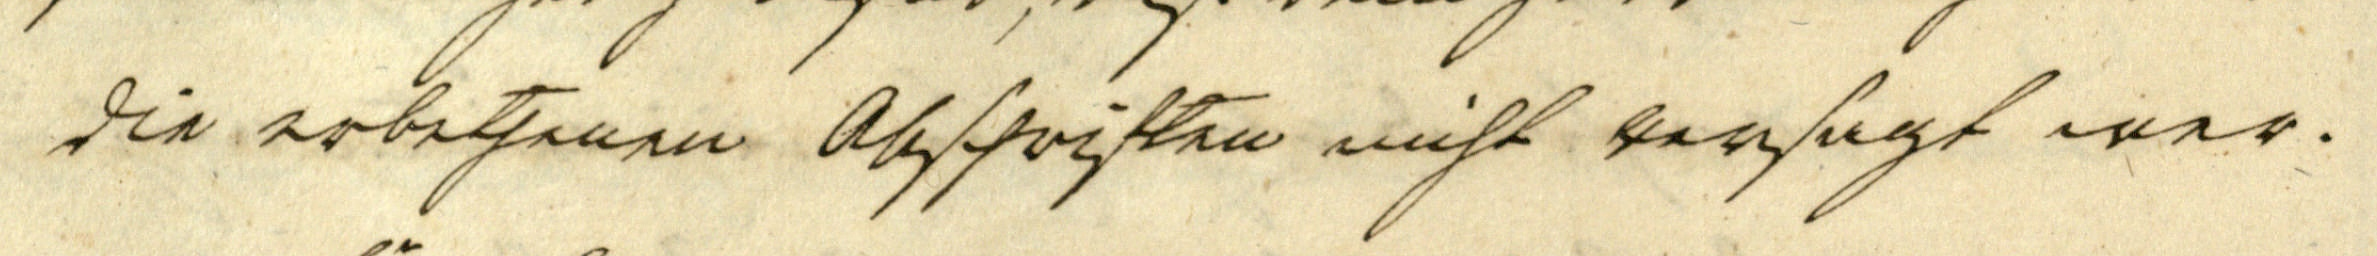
die erbethenen Abschriften nicht versagt wer¬
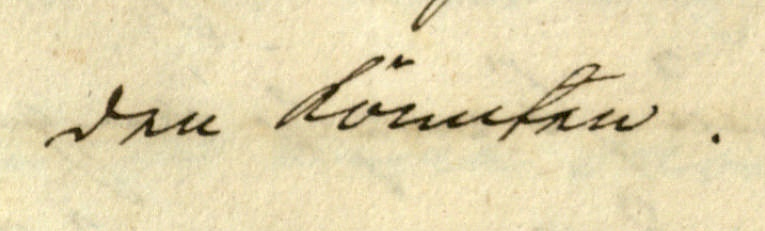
den könnten.
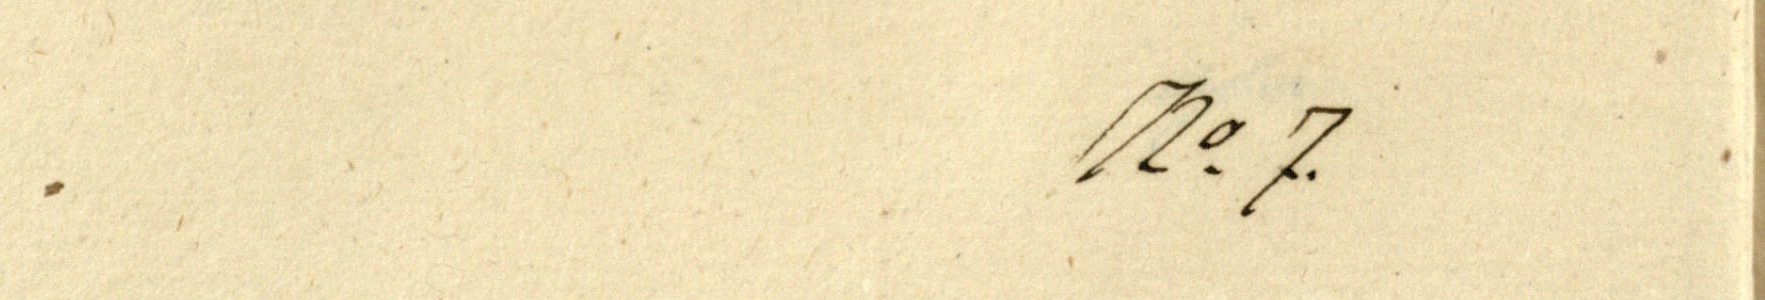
No 7.
